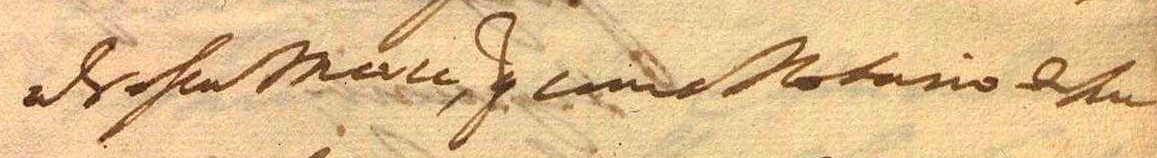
a Vossa merce, q̄ com o Notario de seu
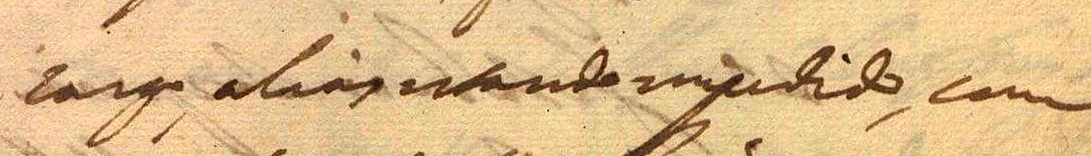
cargo, alias estando impedido, com
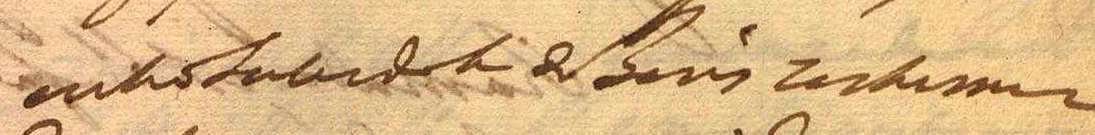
outro sacerdote de bons costumes
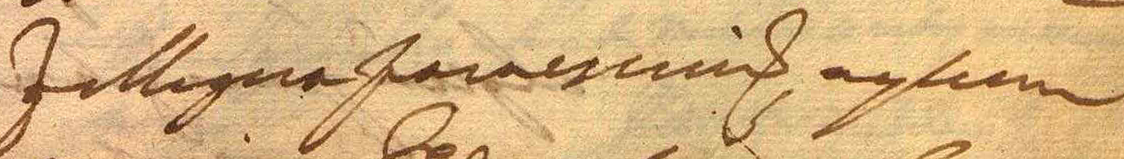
q̄ ellegera para escriuaõ, a quem
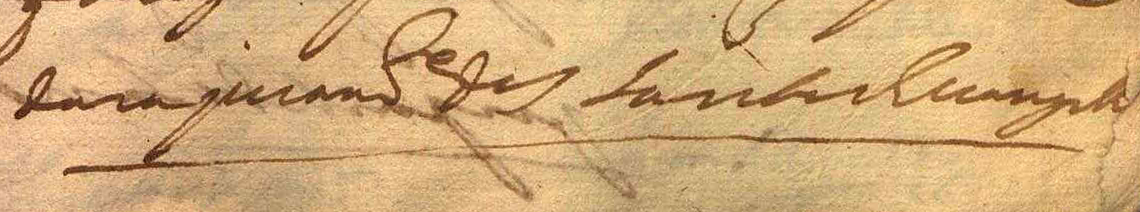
dara juramto dos santos Euangelh
